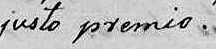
"justo premio.
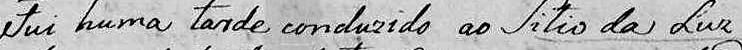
Fui huma tarde conduzido ao Sitio da Luz
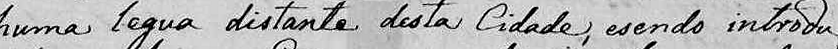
huma legua distante desta Cidade, e sendo introdu
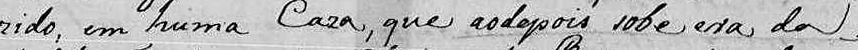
zido, em huma Caza, que ao depois sobe era da
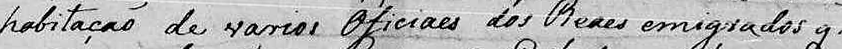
habitaçaõ de varios Oficiaes dos Reaes emigrados q̄.
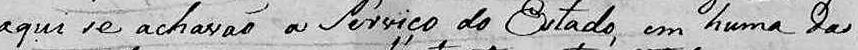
aqui se achavaõ a Serviço do Estado, em huma das
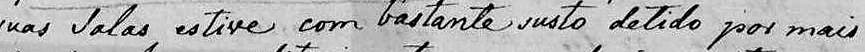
suas salas, estive com bastante susto detido por mais
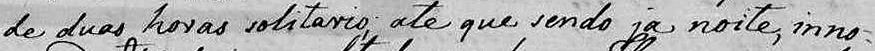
de duas horas solitario, ate que sendo ja noite, inno
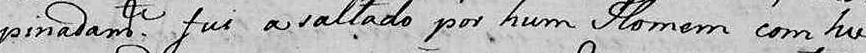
pinadam.te fui asaltado por un Homem com hu
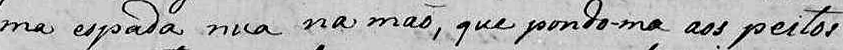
ma espada nua na maõ, que pondo-ma aos peitos
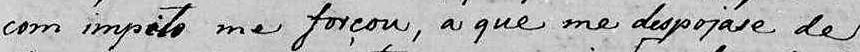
com impito me forçou, a que me despojase de
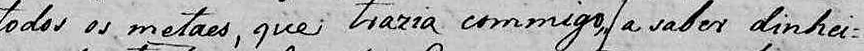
todos os metaes, que trazia commigo, [a saber dinhei
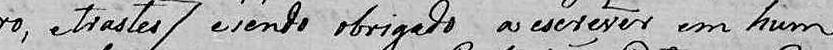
ro, e trastes] e sendo obrigado a escrever em hum
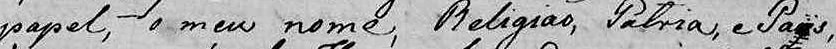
papel, o meu nome, Religiaõ, Patria, e Pais,
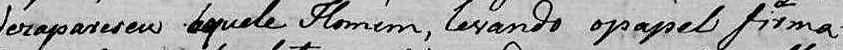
dezapareseu aquele Homem, levando o papel firma
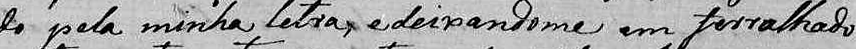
do pela minha letra, e deixandome em ferralhado
